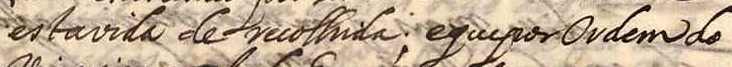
esta vida de recolhida; e que por Ordem do
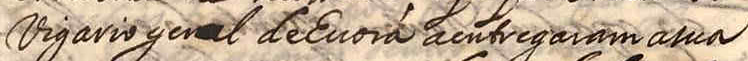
Vigario geral de Euora a entregaram a sua
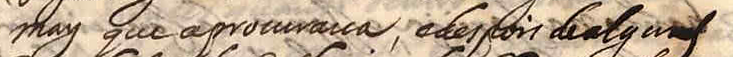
may que a procuraua, e despois de alguns
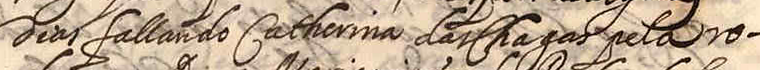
dias fallando Catherina das Chagas pela ro
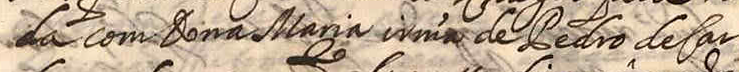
da com Dona Maria irmā de Pedro de Car
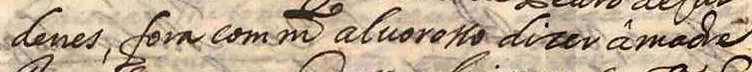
denes, fora com mto aluorosso dizer â madre
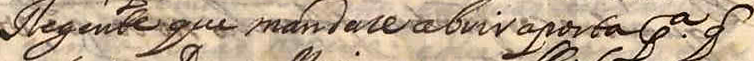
Regente que mandase abrir a porta p.a q̄
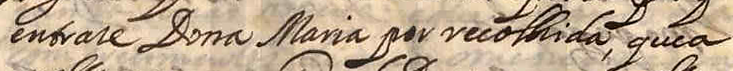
entrase Dona Maria por recolhida, que a
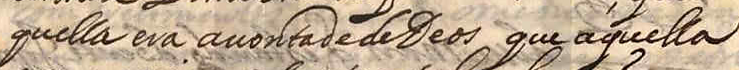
quella era a uontade de Deos que aquella
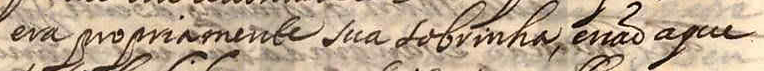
era propriamente sua sobrinha, e naõ a que
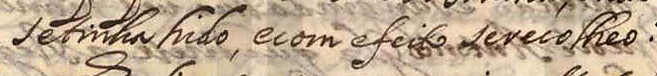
se tinha hido, e com efeito se recolheo.
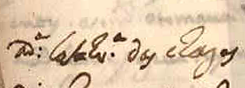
a d.a Cathr.a das chagas
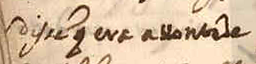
disse q̄ era a vontade
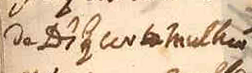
de Ds̄ q̄ certa mulher
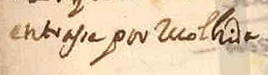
entrasse por Recolhida
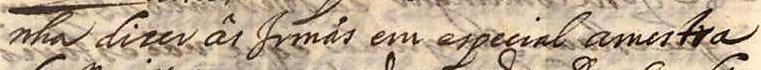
nha dizer âs Jrmās em especial a mestra
